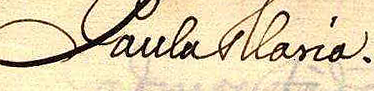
Paula Maria.
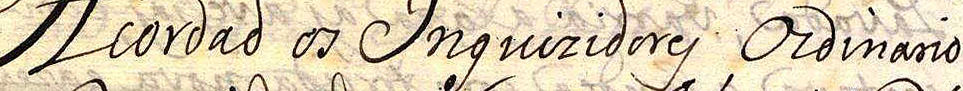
Acordaõ os Inquizidores, Ordinario,
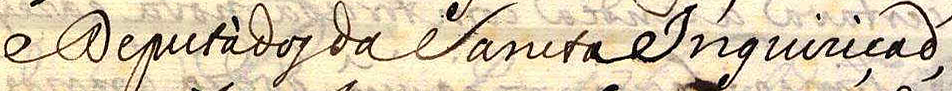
e Deputàdos da Sancta Inquiziçaõ,
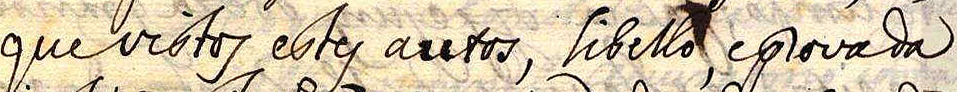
que vistos estes autos, libello, e prova da
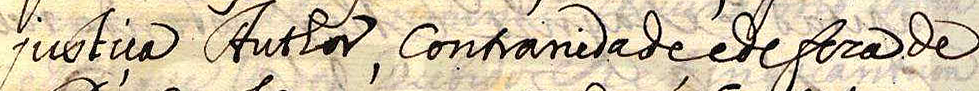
justiça Author, contrariedade, e defeza de
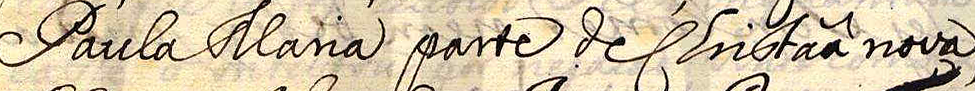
Paula Maria parte de Christaã nova,
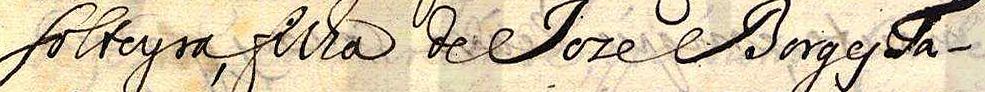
solteyra, filha de Ioze Borges Ta
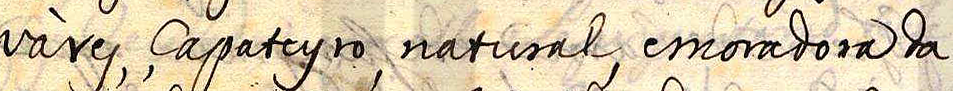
vàres, çapateyro, natural, e moradora da
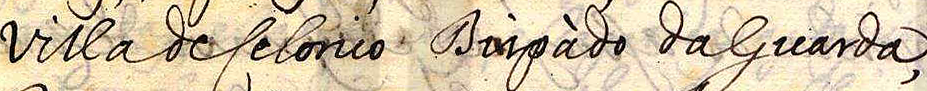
villa de Celorico Bispàdo da Guarda,
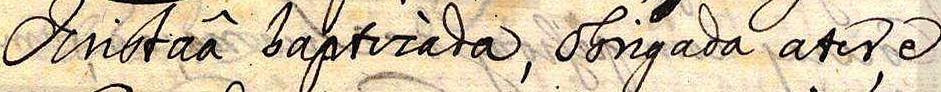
christaã baptizàda, obrigada a ter, e
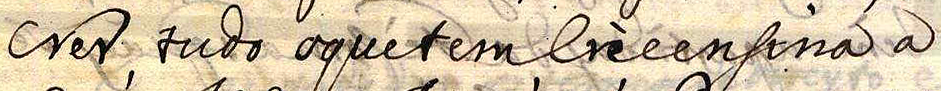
crer, tudo o que tem, Crè e ensina a
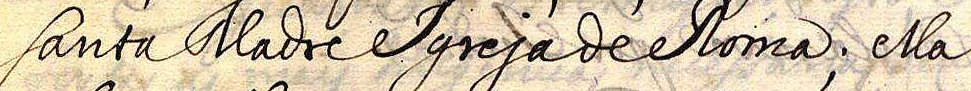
santa Madre Igreja de Roma; ella
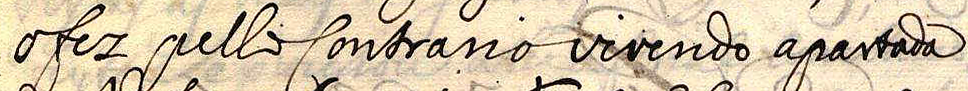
o fez pello Contrario, vivendo apartada
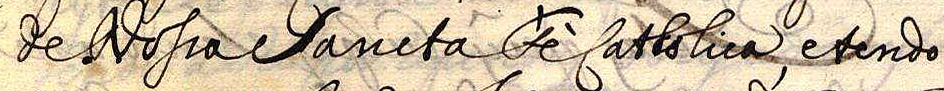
de Nossa Sancta Fè Catholica, e tendo
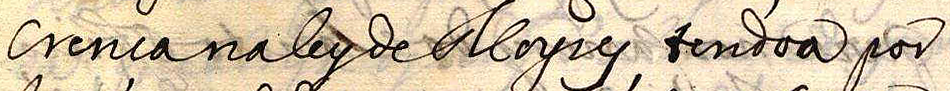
crença na ley de Moyzes, tendoa por
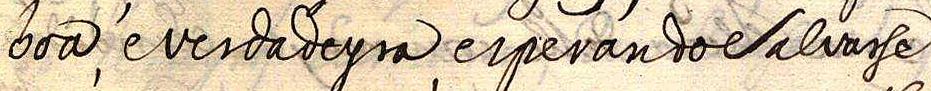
boa, e verdadeyra, esperando Salvarse
